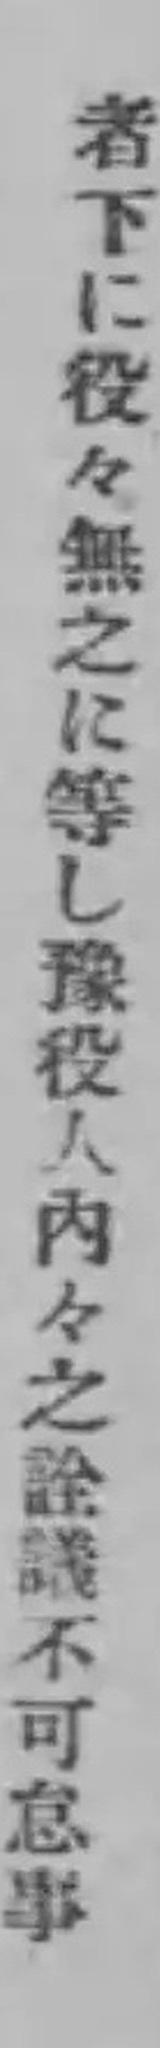者下に役々無之に等し予役人内々之詮議不可怠事
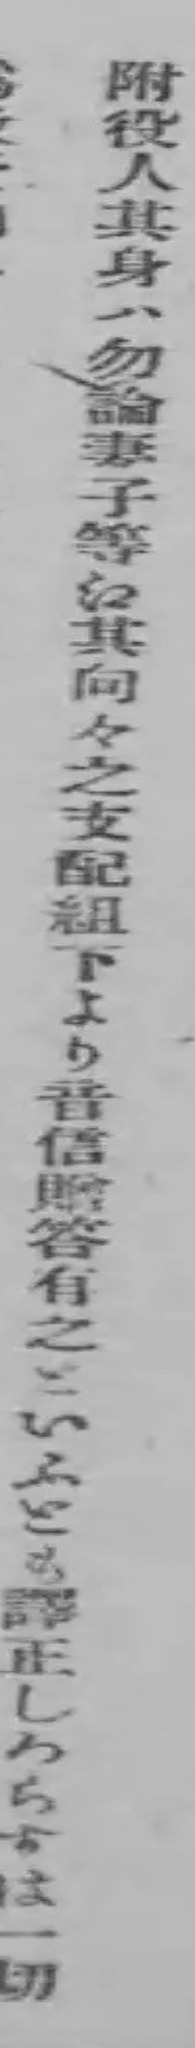附役人其身は勿論妻子等え其向々之支配組下より音信贈答有之といふとも訳正しからすは一切
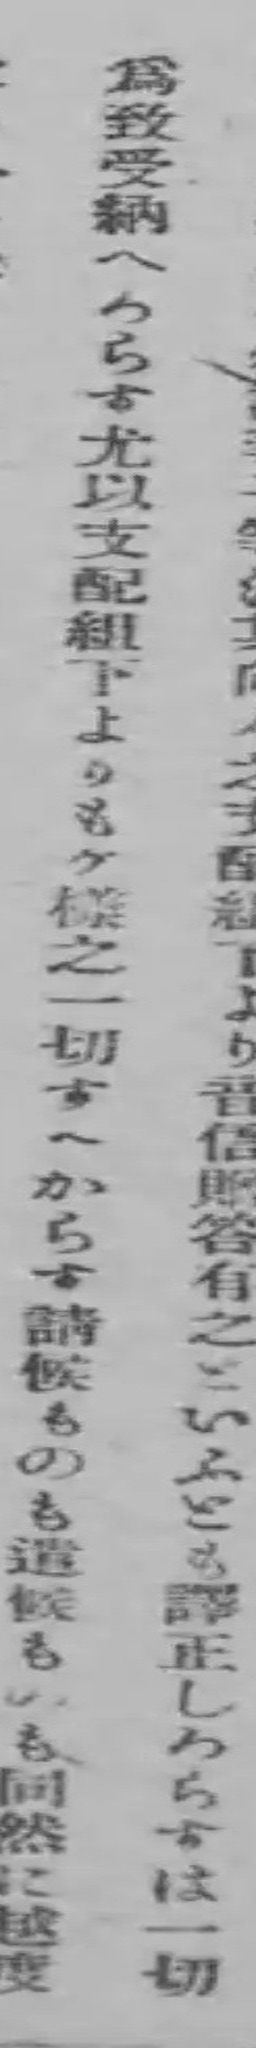為致受納へからす尤以支配組下よりもケ様之一切すへからす請候ものも遣候ものも同然に越度
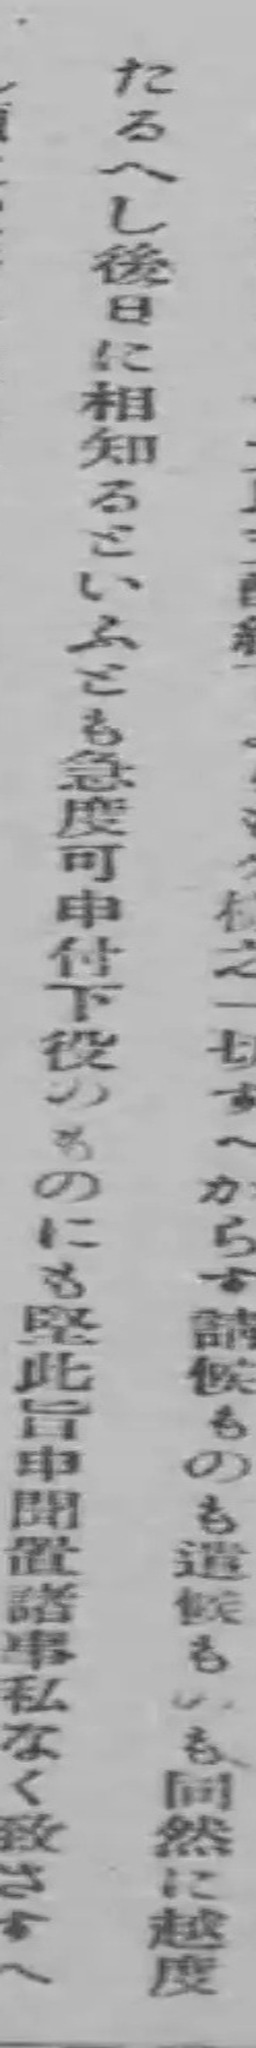たるへし後日に相知るといふとも急度可申付下役のものにも堅此旨申聞置諸事私なく致さすへ
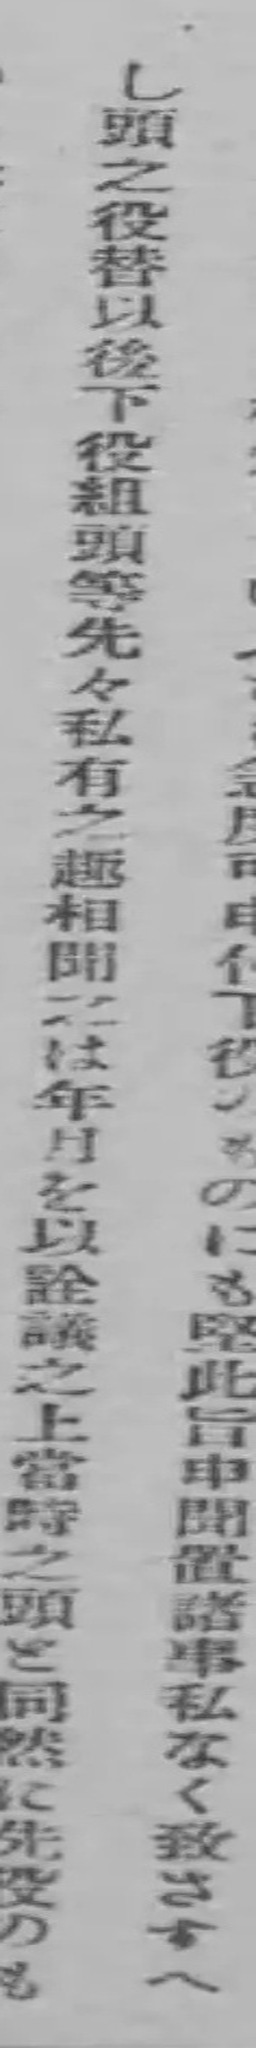し頭之役替以後下役組頭等先々私有之趣相聞之は年月を以詮議之上当時之頭と同然に先役のも
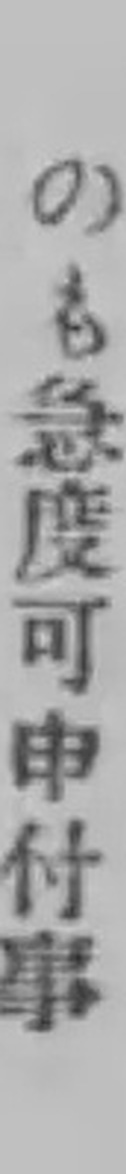のも急度可申付事
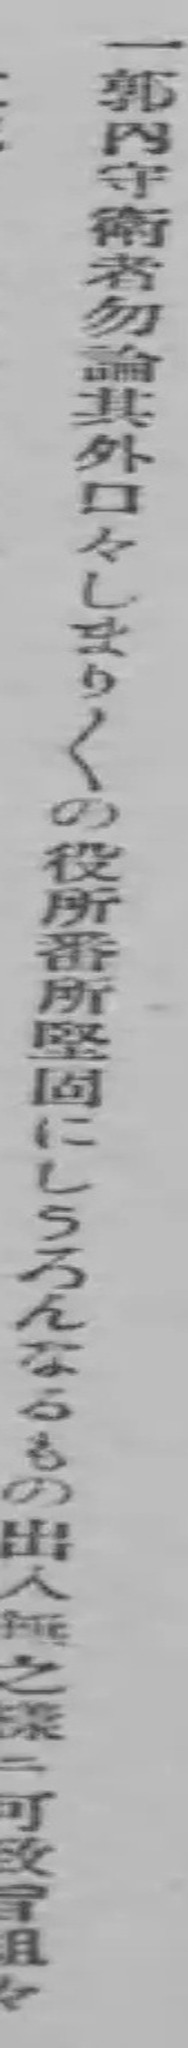一郭内守衛者勿論其外口々しまり〳〵の役所番所堅固にしうろんなるもの出入無之様ニ可致旨組々
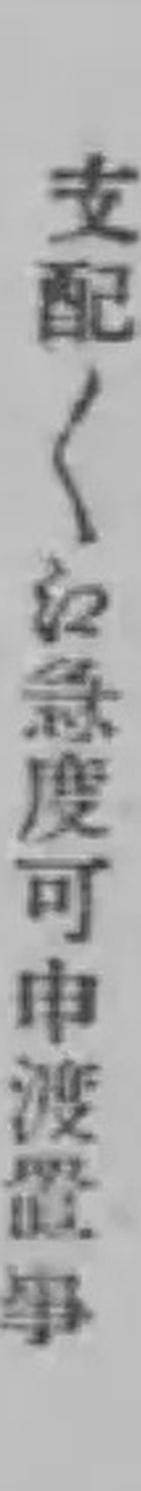支配〳〵え急度可申渡置事
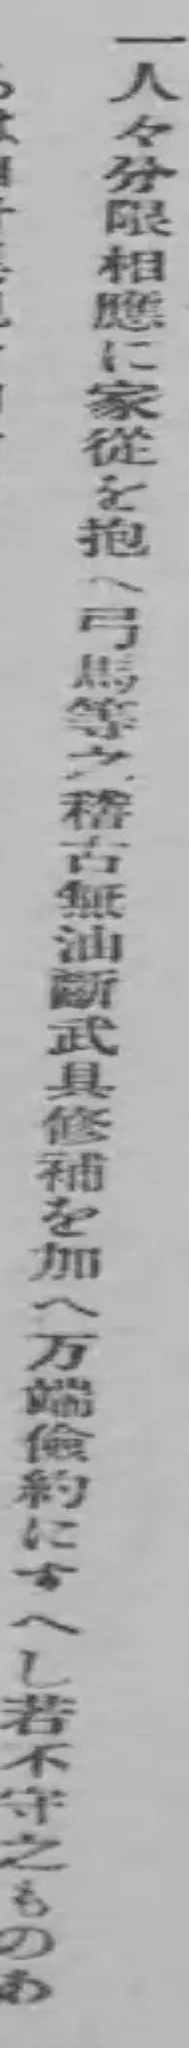一人々分限相応に家従を抱へ弓馬等之稽古無油断武具修補を加へ万端倹約にすへし若不守之ものあ
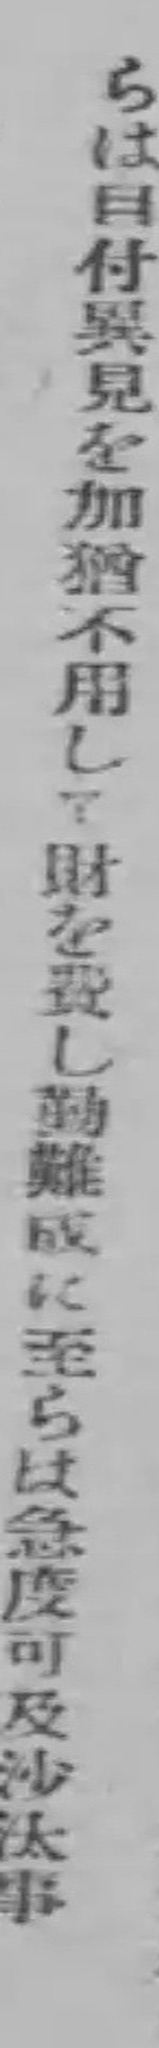らは目付異見を加猶不用して財を費し勤難成に至らは急度可及沙汰事
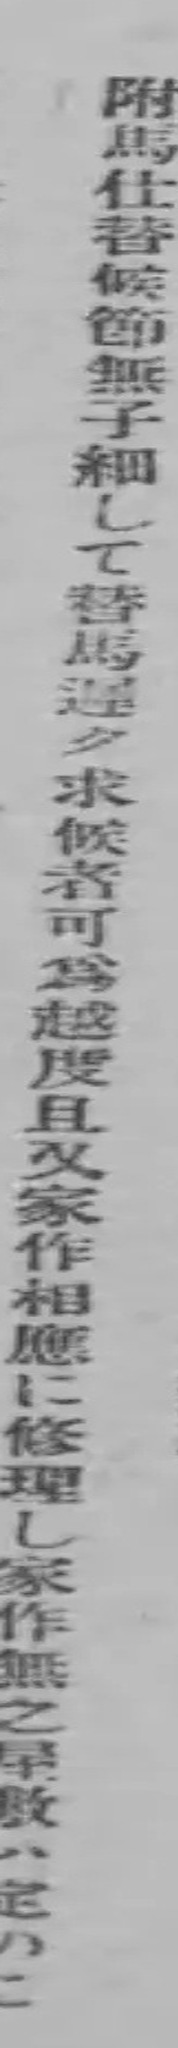附馬仕替候節無子細して替馬遅ク求候者可為越度且又家作相応に修理し家作無之屋敷は定のこ
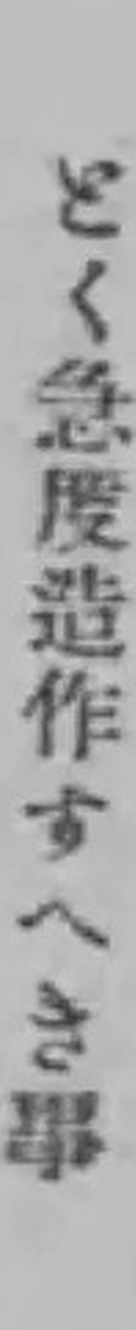とく急度造作すへき事
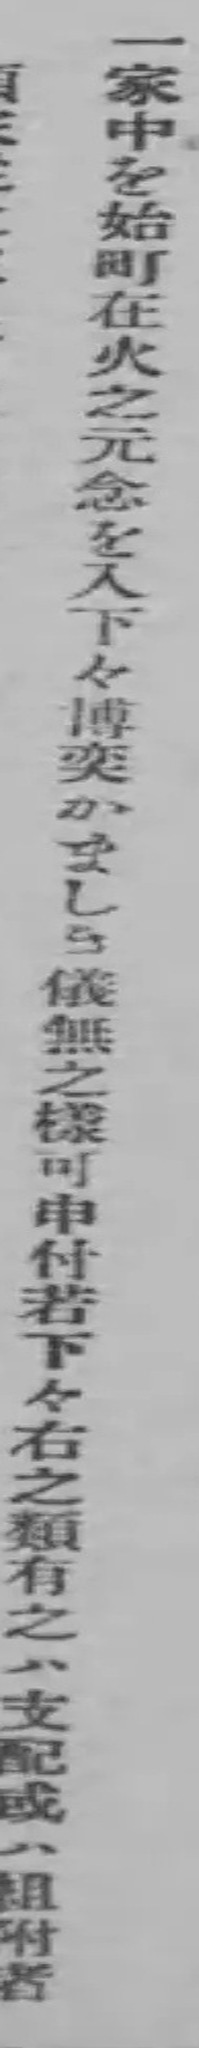一家中を始町在火之元念を入下々博奕かましき儀無之様可申付若下々右之類有之は支配或は組附者
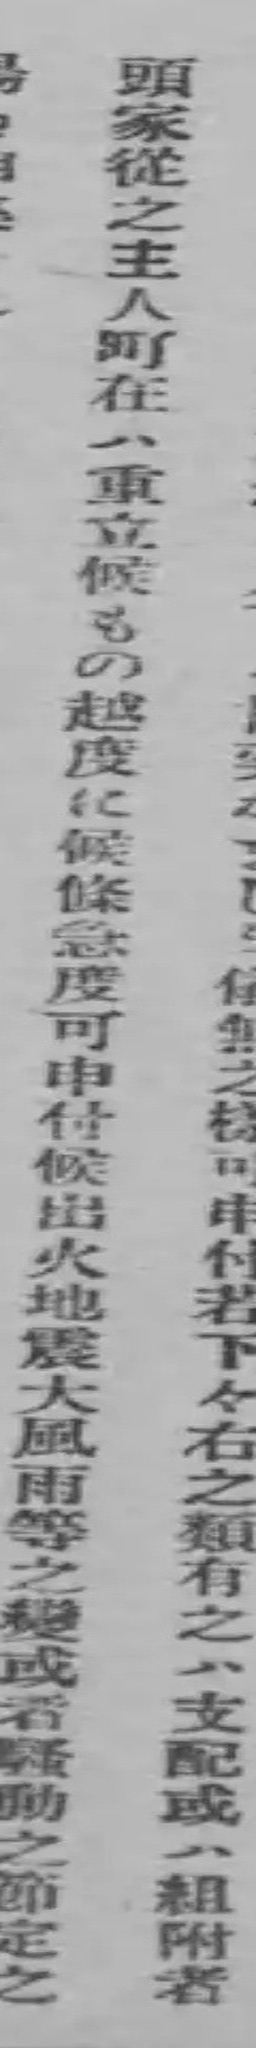頭家従之主人町在は重立候もの越度に候条急度可申付候出火地震大風雨等之変或者騒動之節定之
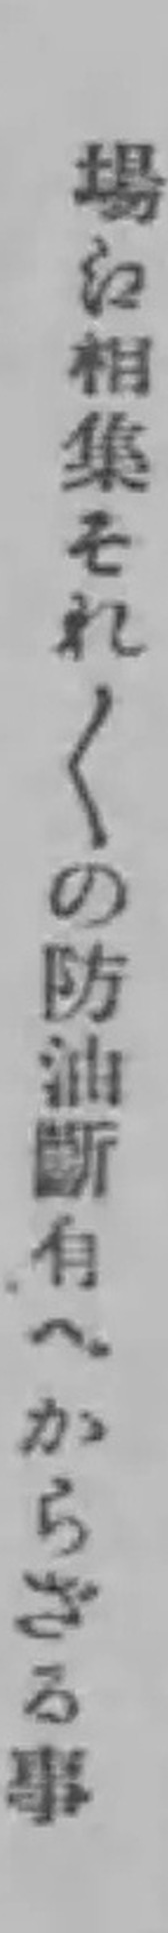場え相集それ〳〵の防油断有へからざる事
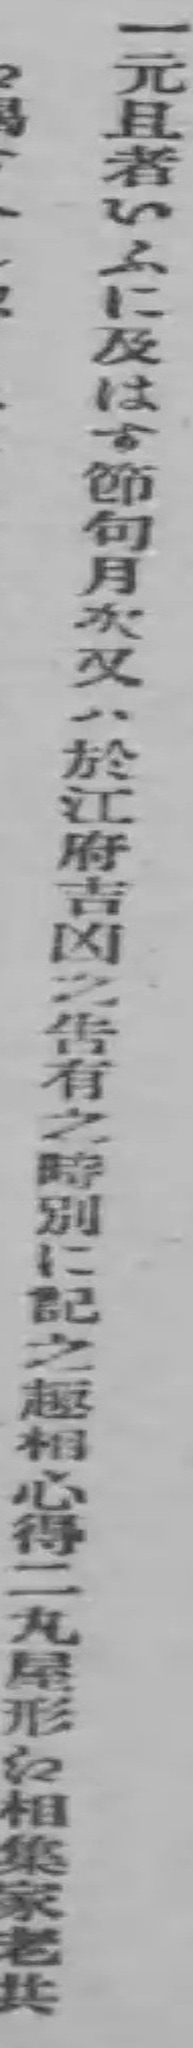一元且者いふに及はす節句月次又は於江府吉凶之告有之時別に記之趣相心得二丸屋形え相集家老共
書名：豊橋市史談
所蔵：国立国会図書館 National Diet Library, JAPAN
